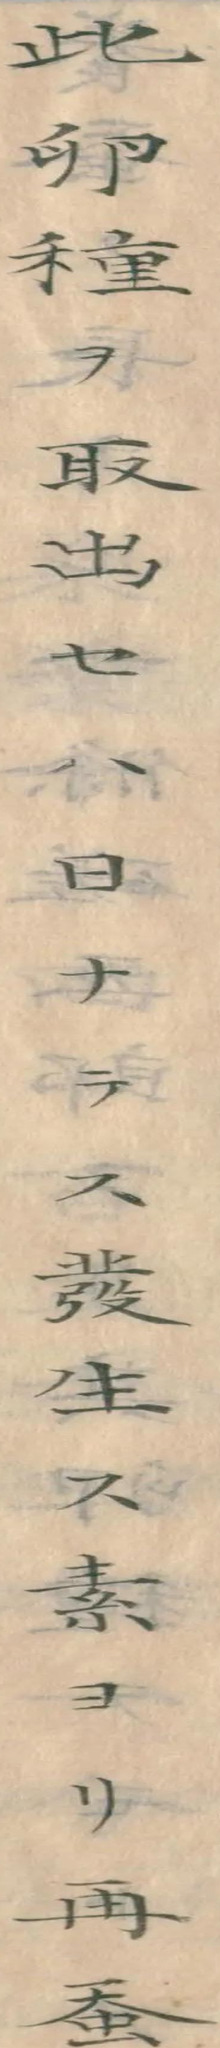此卵種ヲ取出セハ日ナラス発生ス素ヨリ再蚕
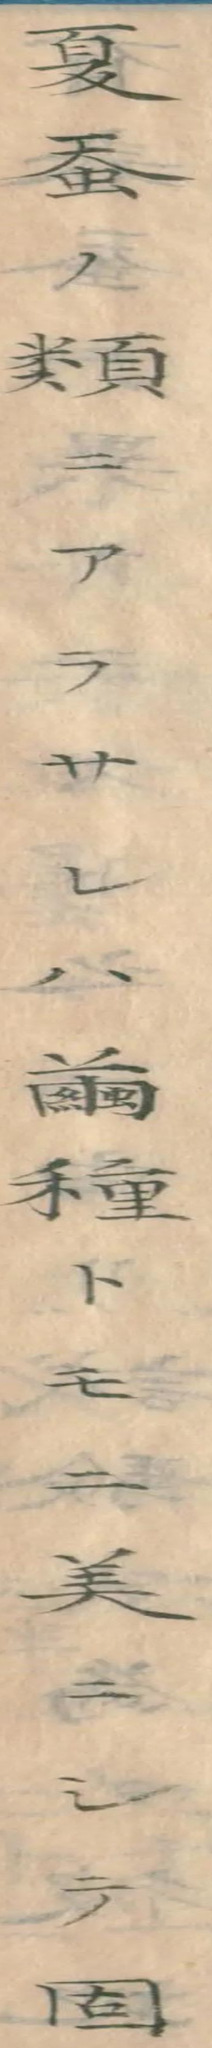夏蚕ノ類ニアラサレハ繭種トモニ美ニシテ固

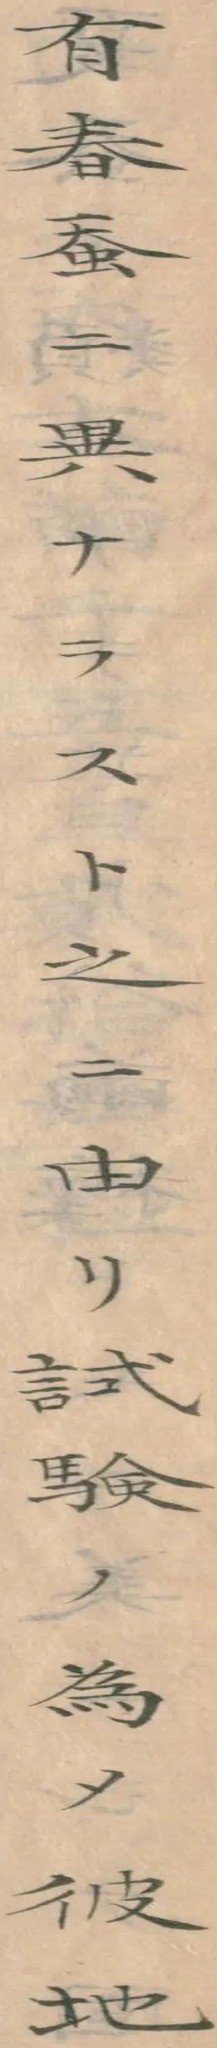有春蚕ニ異ナラスト之ニ由リ試験ノ為メ彼地
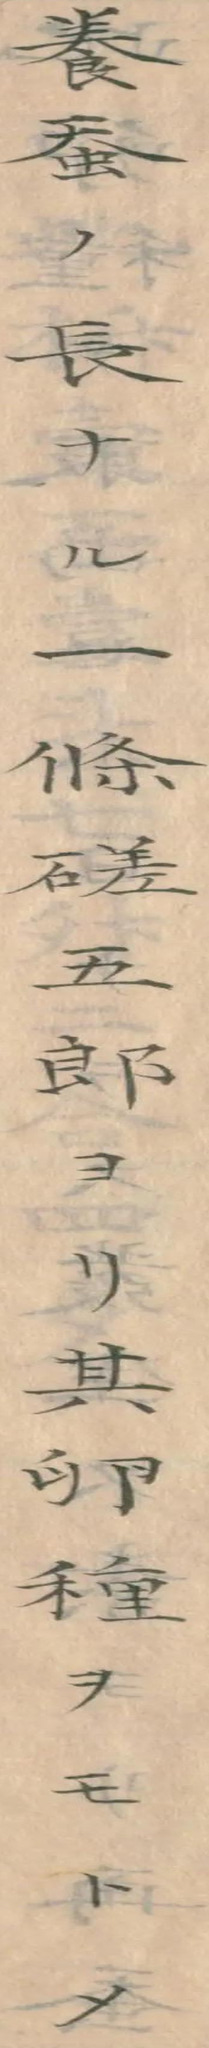養蚕ノ長ナル一条磋五郎ヨリ其卵種ヲモトメ
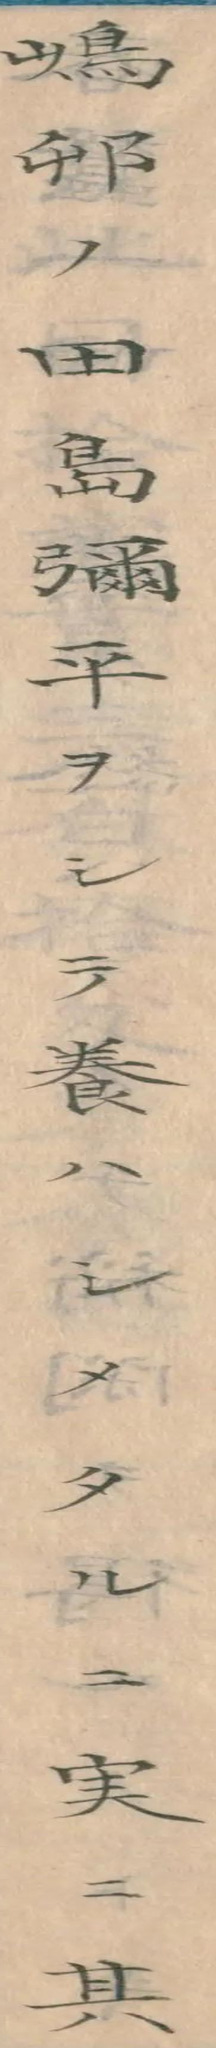嶋邨ノ田島弥平ヲシテ養ハシメタルニ実ニ其
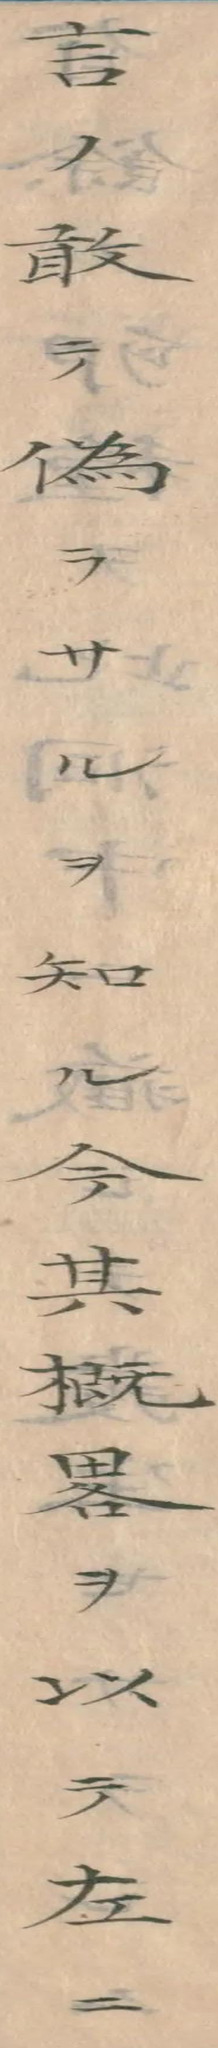言ノ敢テ偽ラサルヲ知ル今其概略ヲ以テ左ニ
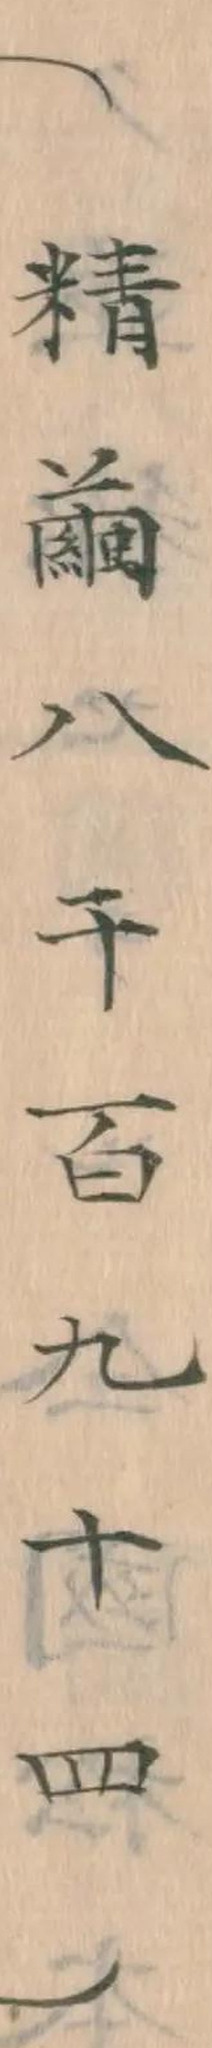┌精繭八千百九十四┐
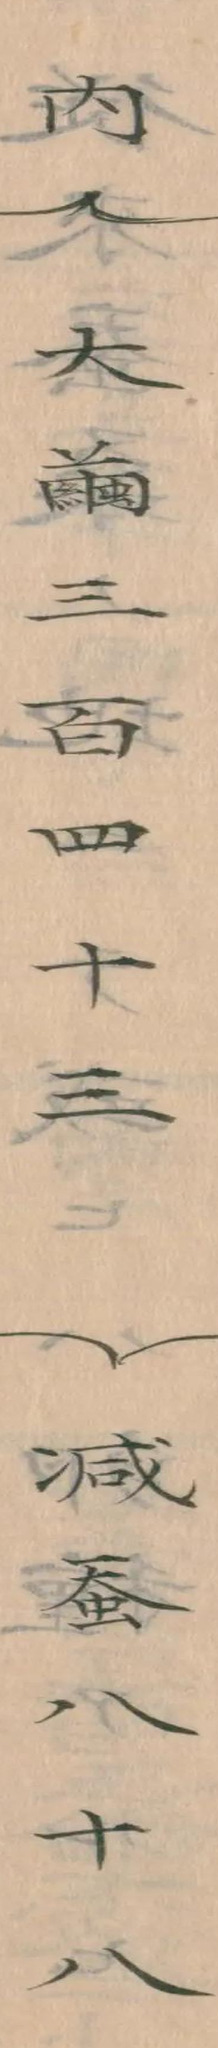内┤大繭三百四十三├減蚕八十八
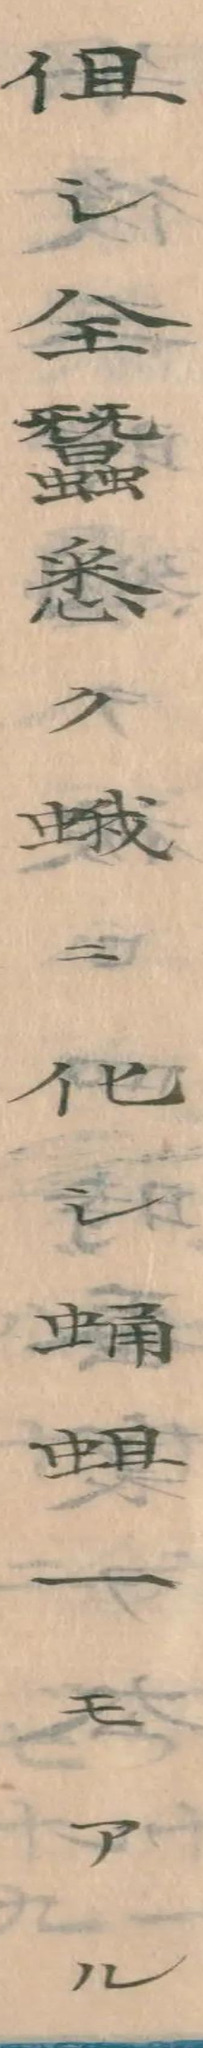但シ全蚕悉ク蛾ニ化シ蛹蛆一モアル
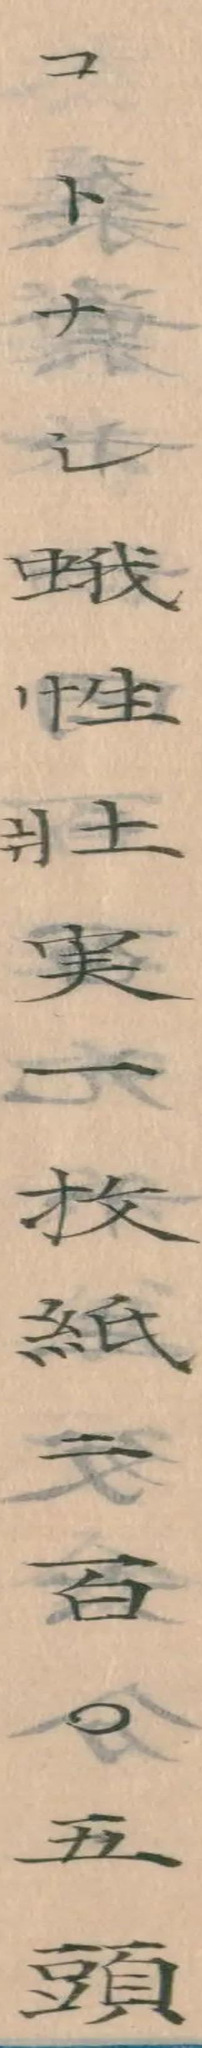コトナシ蛾性壮実一枚紙ニ百〇五頭
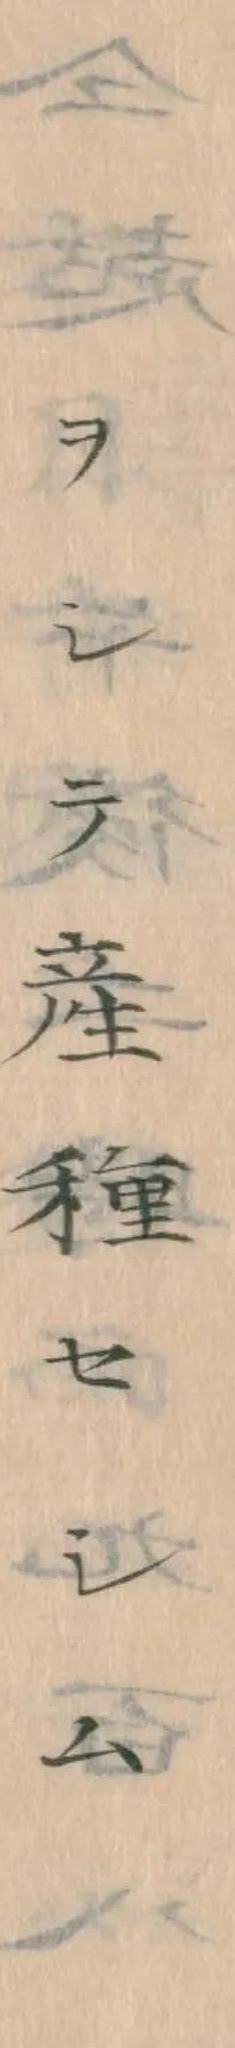ヲシテ産種セシム
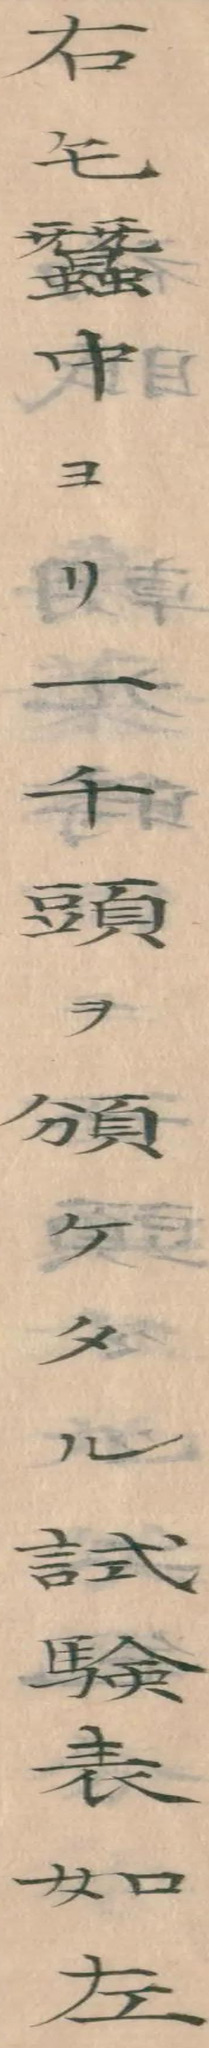右毛蚕中ヨリ一千頭ヲ頒ケタル試験表如左
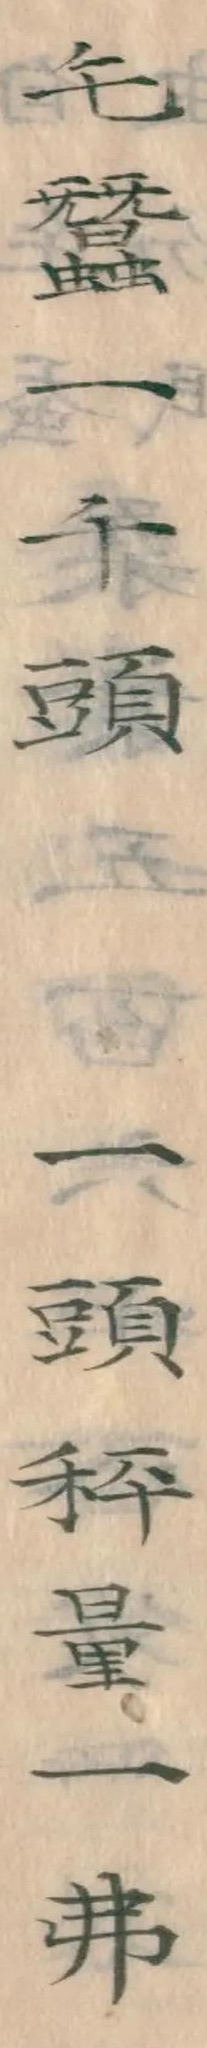毛蚕一千頭一頭秤量一弗
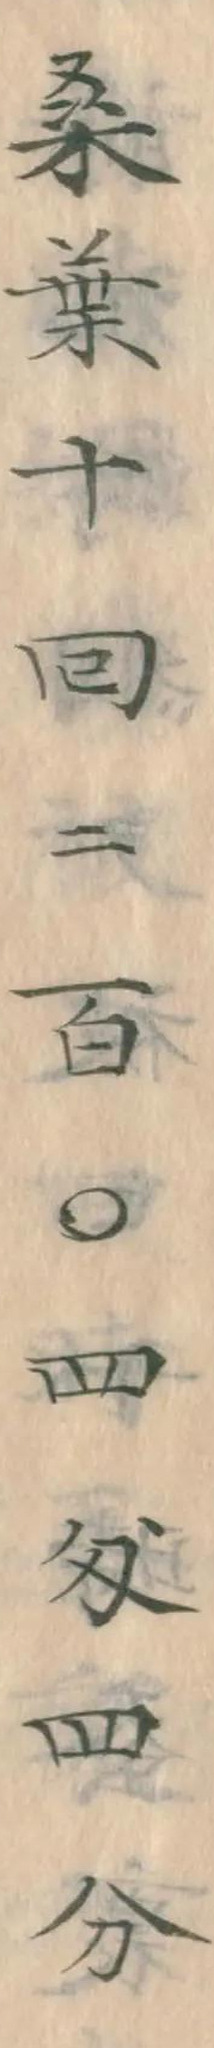桑葉十回ニ百〇四匁四分

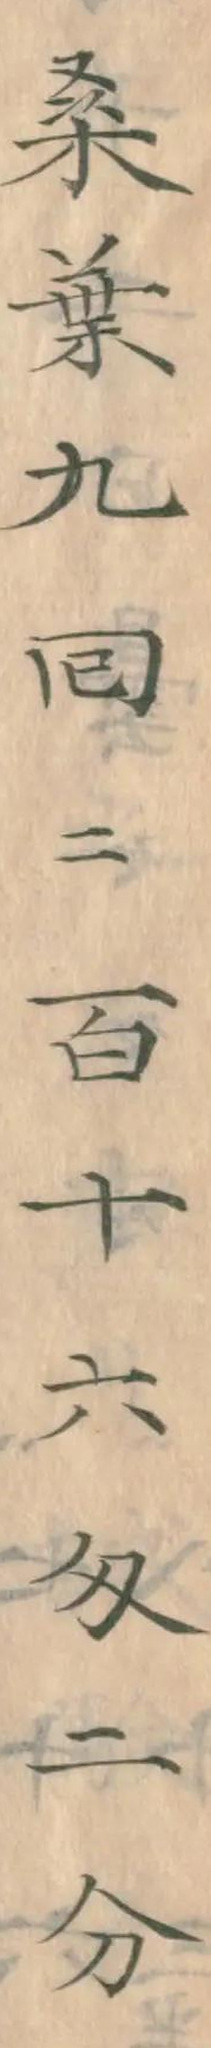桑葉九回ニ百十六匁二分
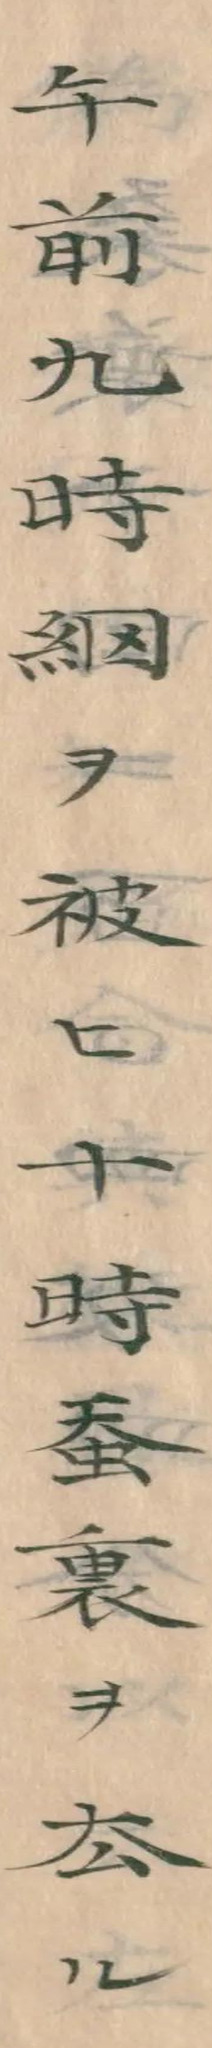午前九時網ヲ被ヒ十時蚕裏ヲ去ル
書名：蚕桑集成
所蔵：国立国会図書館 National Diet Library, JAPAN
